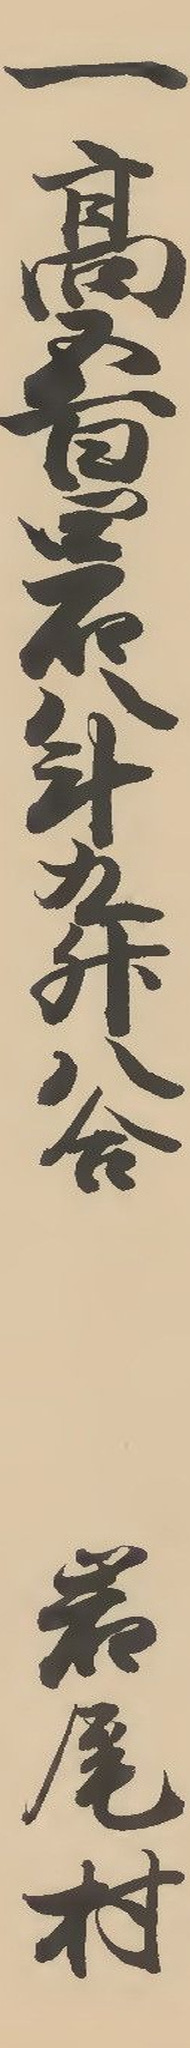一高五百四石八斗九升八合岩尾村
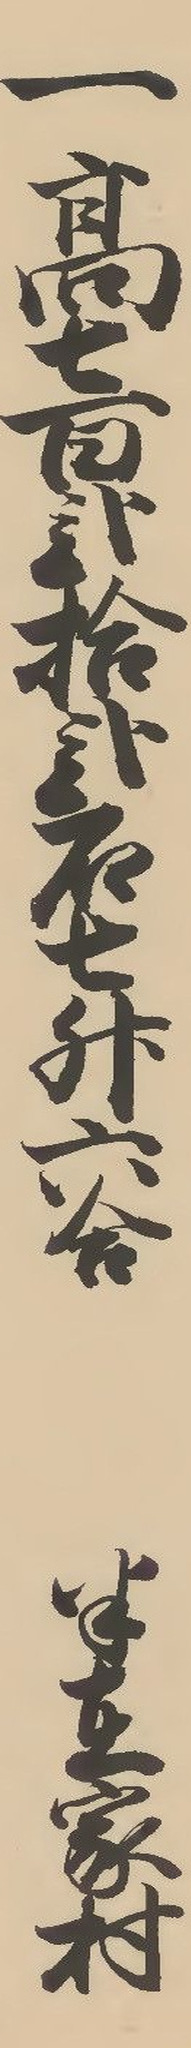一高七百弐拾弐石七升六合半在家村
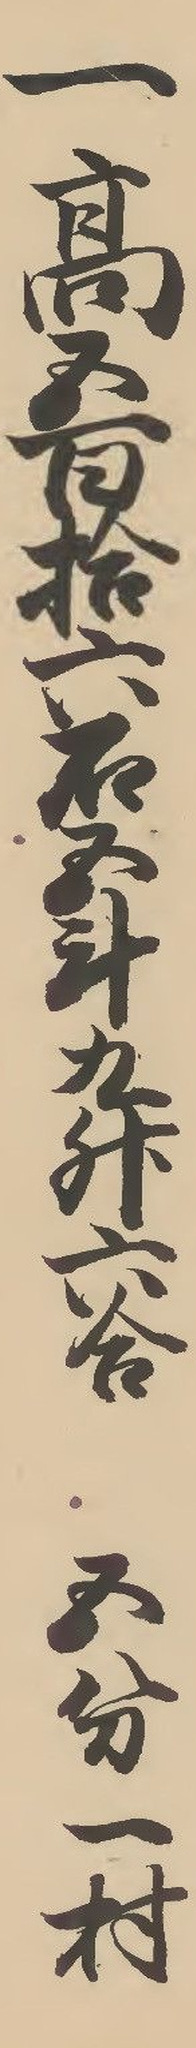一高五百拾六石五斗九升六合五分一村

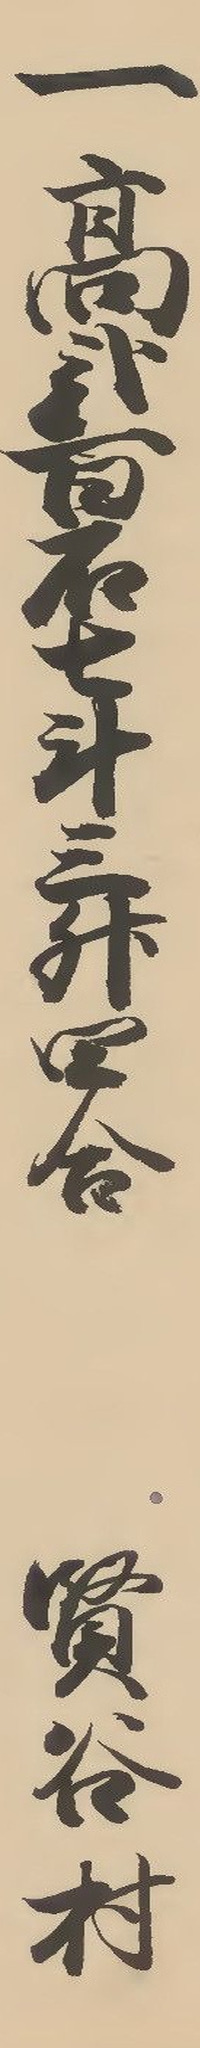一高弐百石七斗三升四合賢谷村
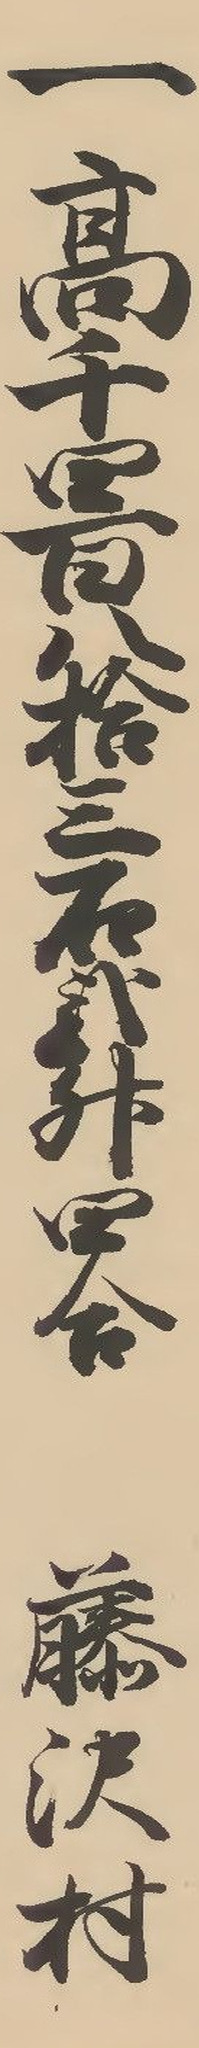一高千四百八拾三石弐升四合藤沢村
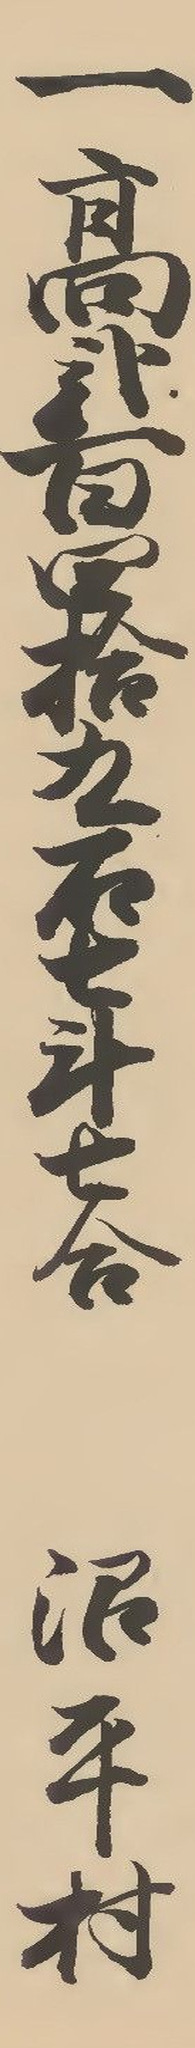一高弐百四拾九石七斗七合沼平村
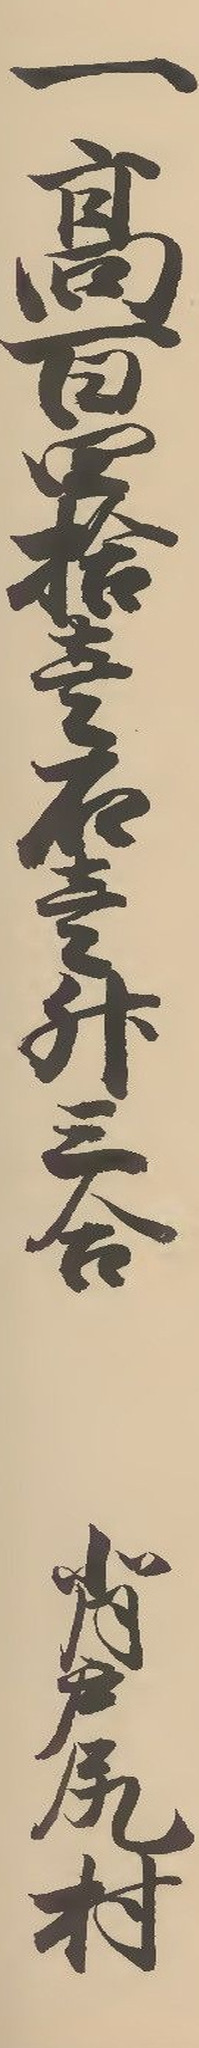一高百四拾壱石壱升三合背戸尻村
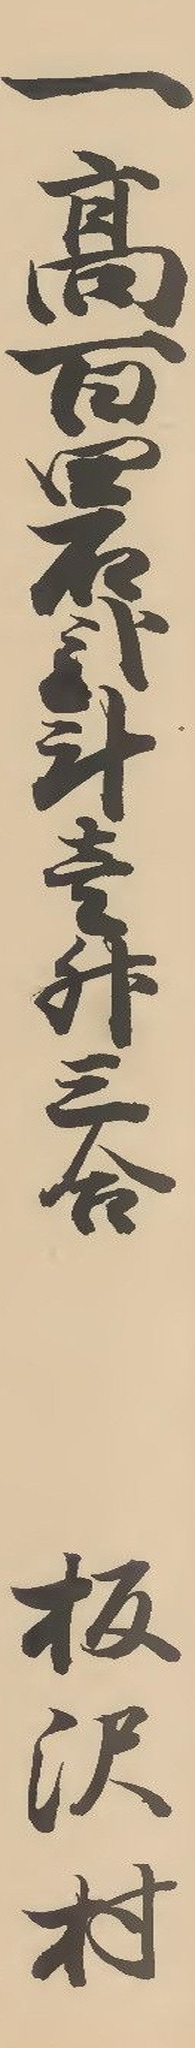一高百四石弐斗壱升三合板沢村
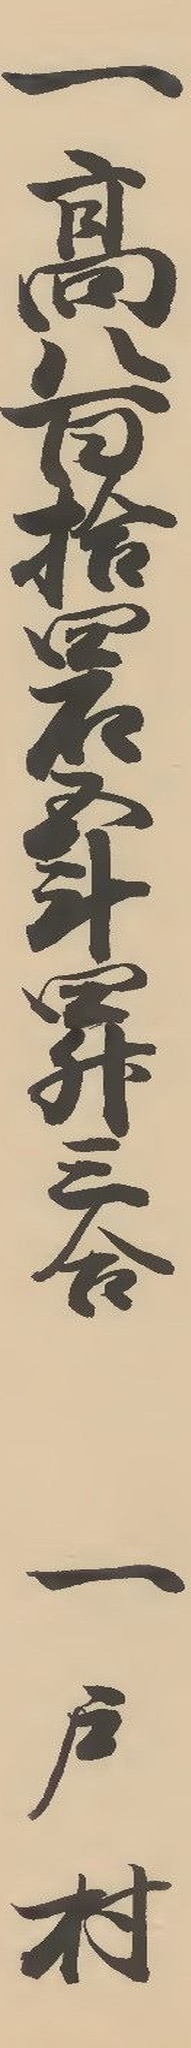一高八百拾四石五斗四升三合一戸村
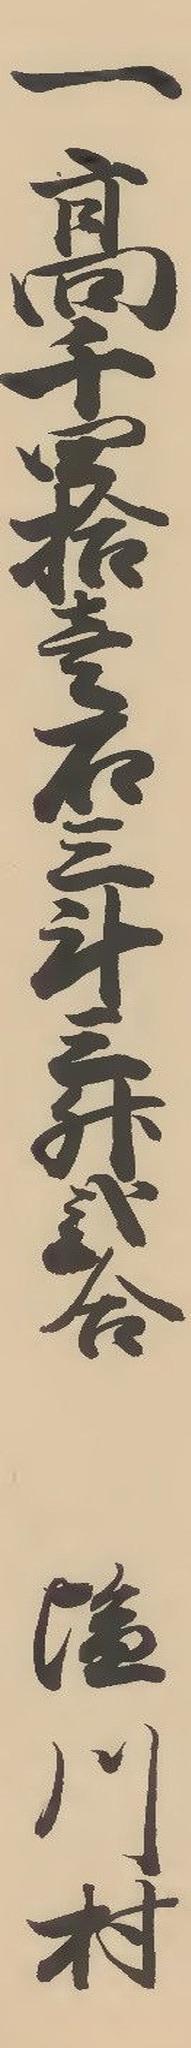一高千四拾壱石三斗三升弐合塩川村
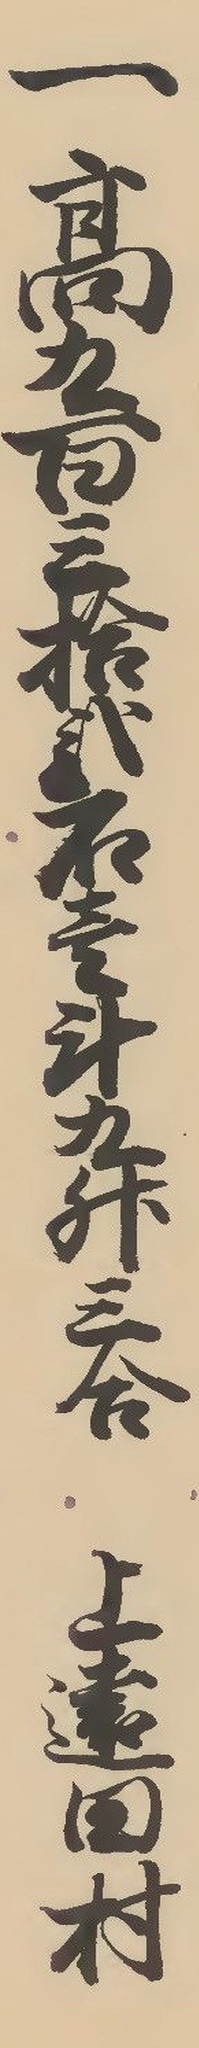一高九百三拾弐石壱斗九升三合上遠田村

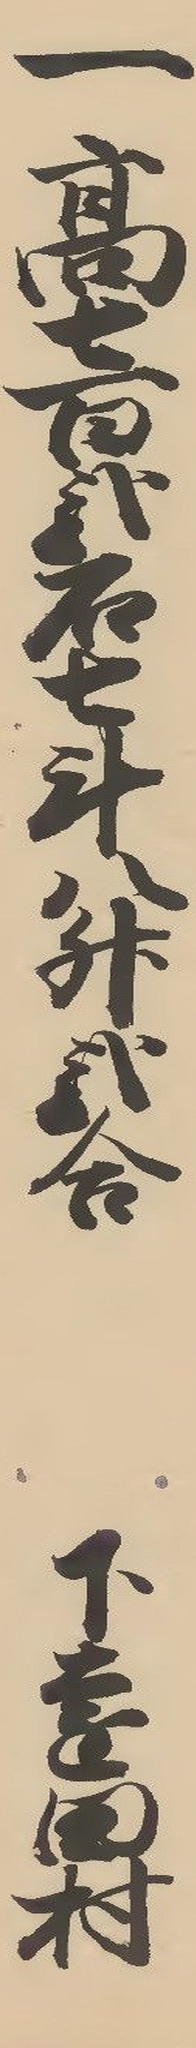一高七百弐石七斗八升弐合下遠田村
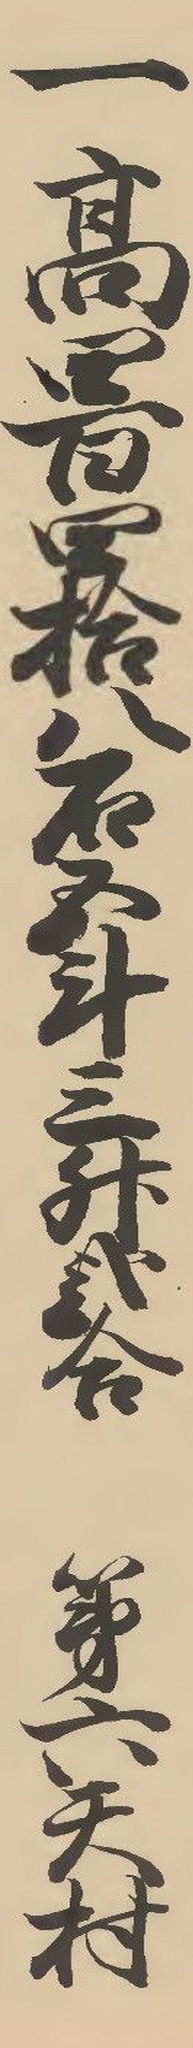一高四百四拾八石五斗三升弐合第六天村
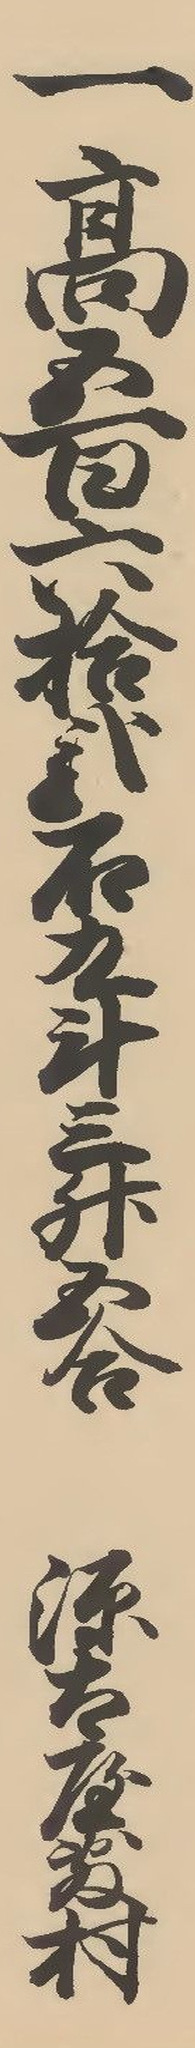一高五百六拾弐石九斗三升五合源太屋敷村
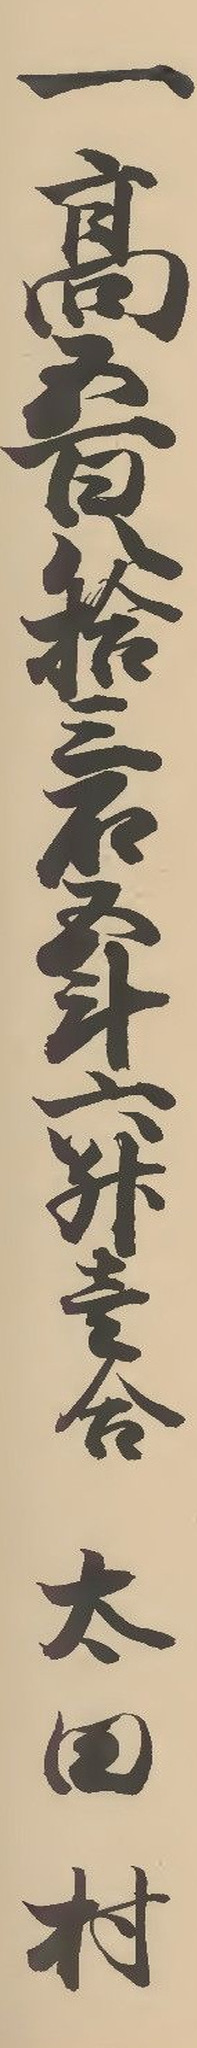一高五百八拾三石五斗六升壱合太田村
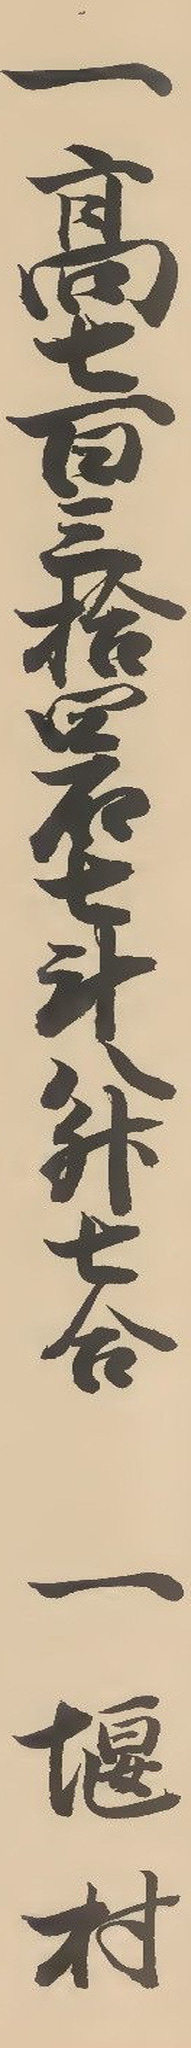一高七百三拾四石七斗八升七合一堰村
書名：陸奥国郷帳　１
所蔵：国立公文書館 National Archives of Japan
